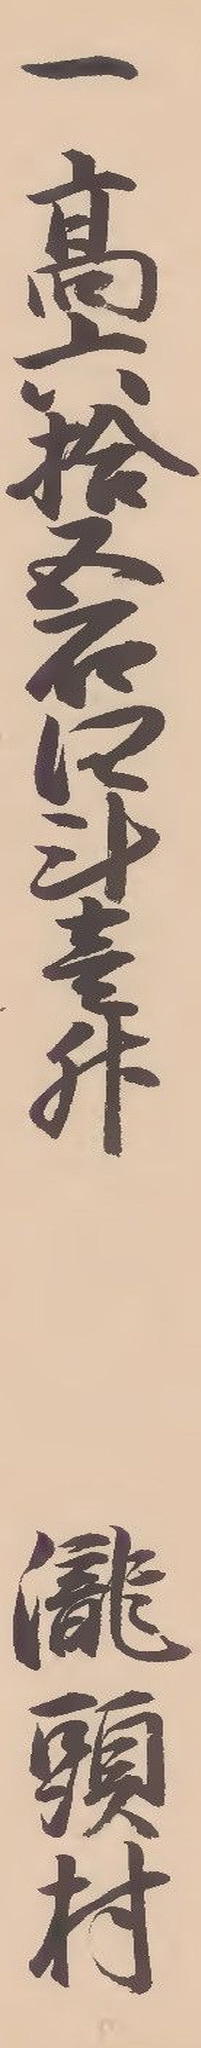一高六拾五石四斗壱升滝頭村

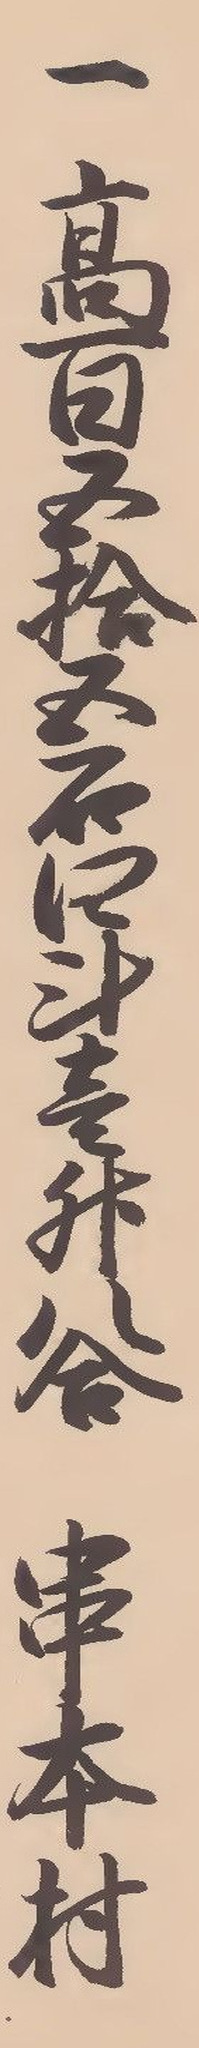一高百五拾五石四斗壱升八合串本村
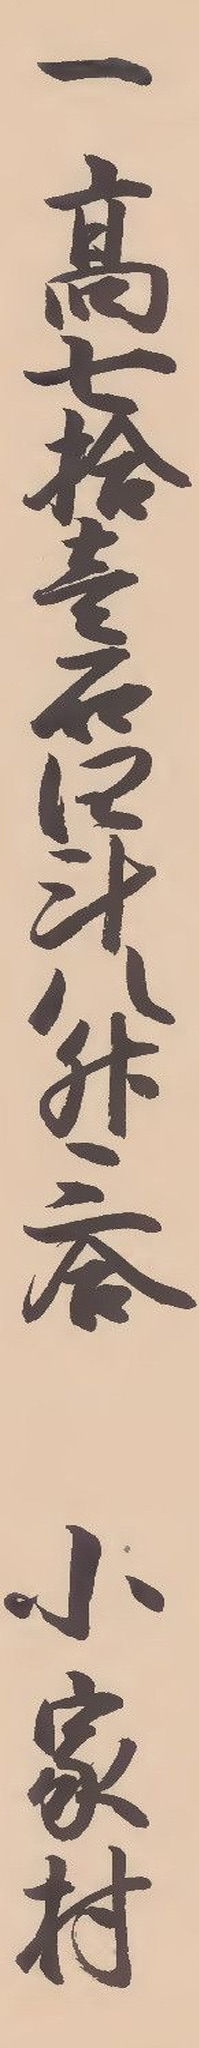一高七拾壱石四斗八升三合小家村
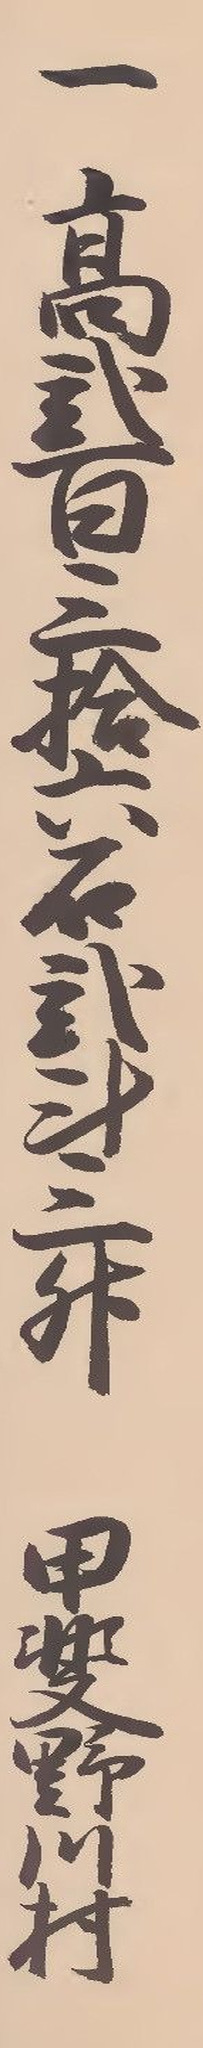一高弐百三拾六石弐斗三升甲斐野川村
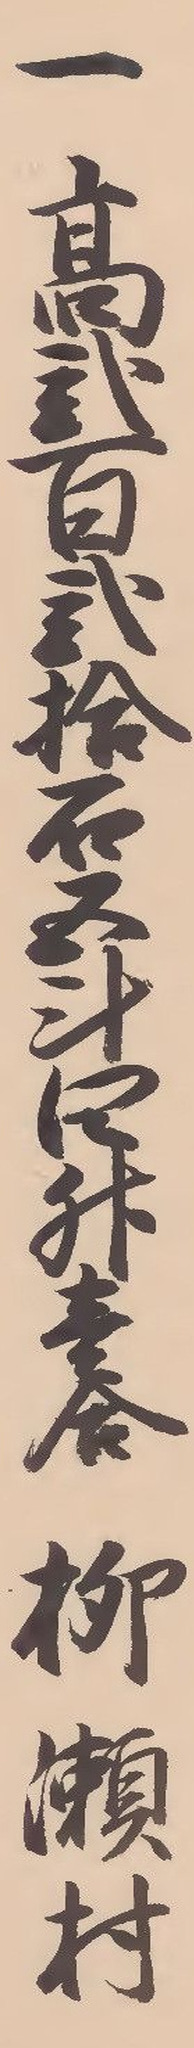一高弐百弐拾石五斗四升壱合柳瀬村
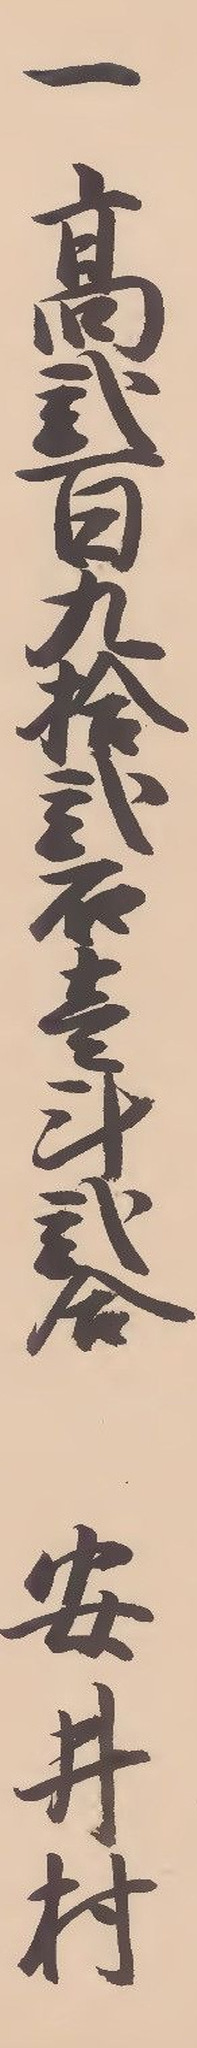一高弐百九拾弐石壱斗弐合安井村
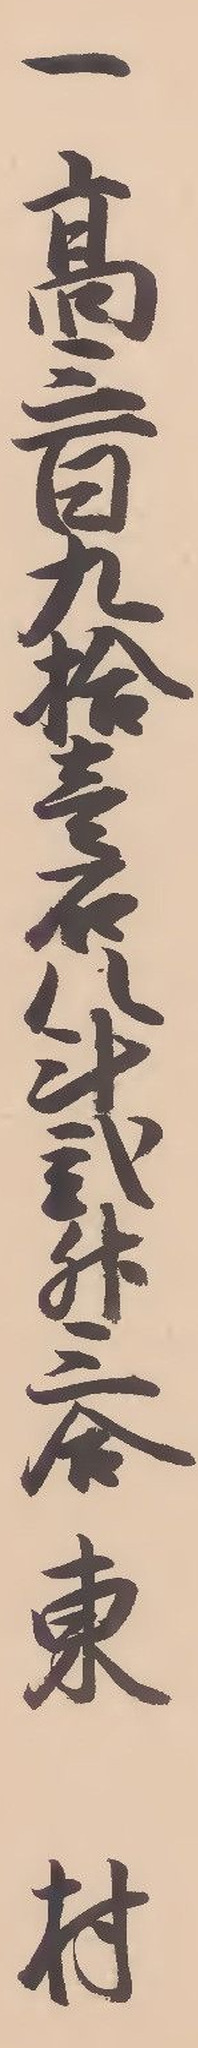一高三百九拾壱石八斗弐升三合東村

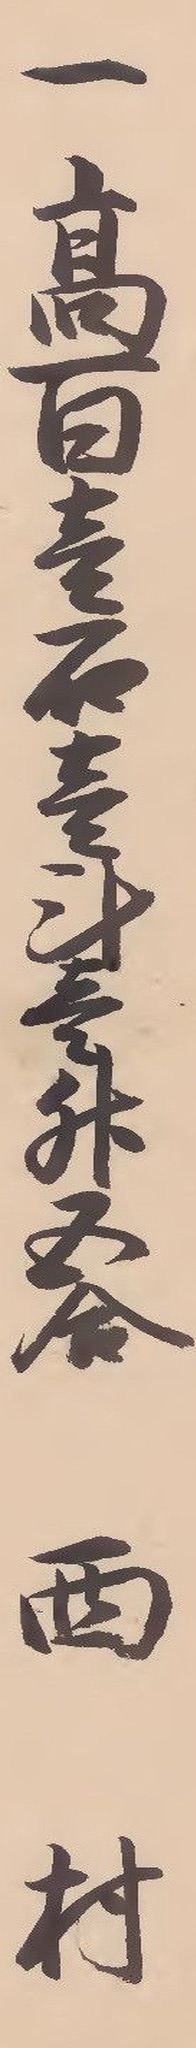一高百壱石壱斗壱升五合西村
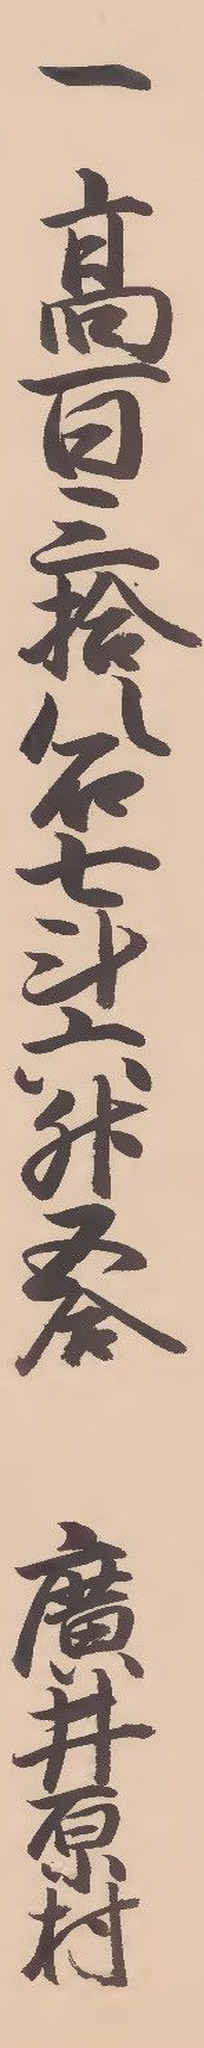一高百三拾八石七斗六升五合広井原村
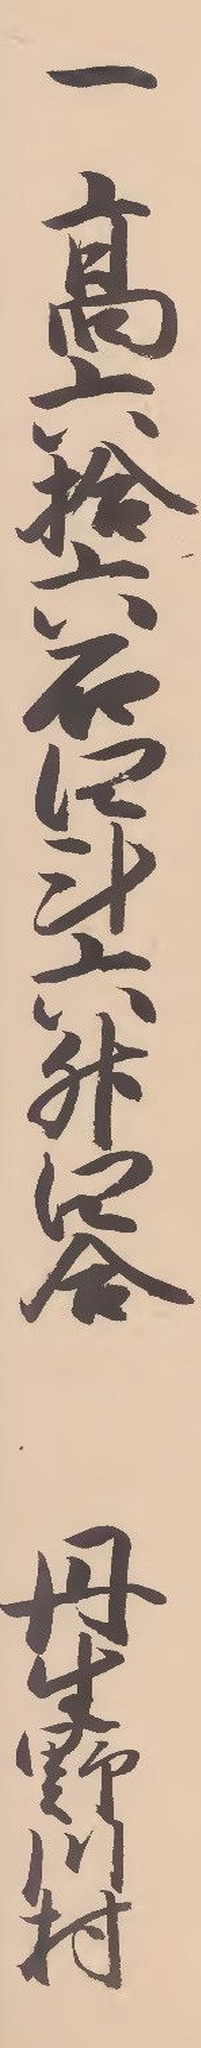一高六拾六石四斗六升四合丹生野川村
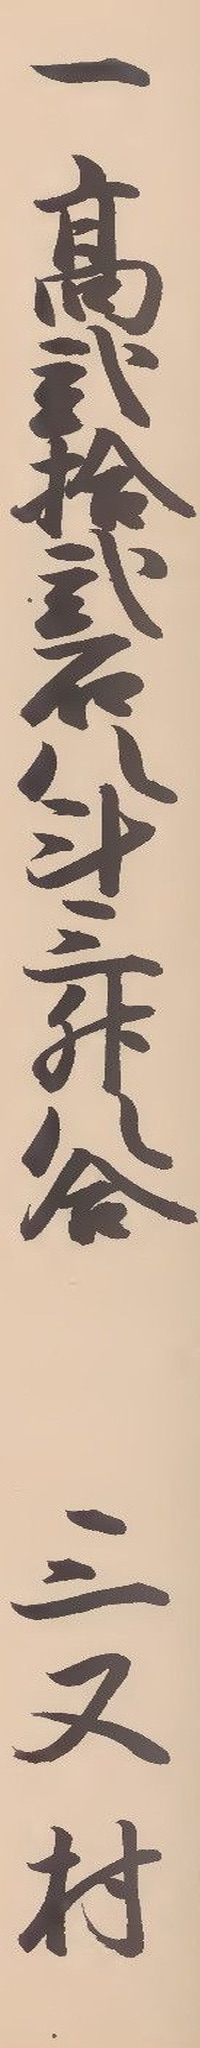一高弐拾弐石八斗三升八合三又村
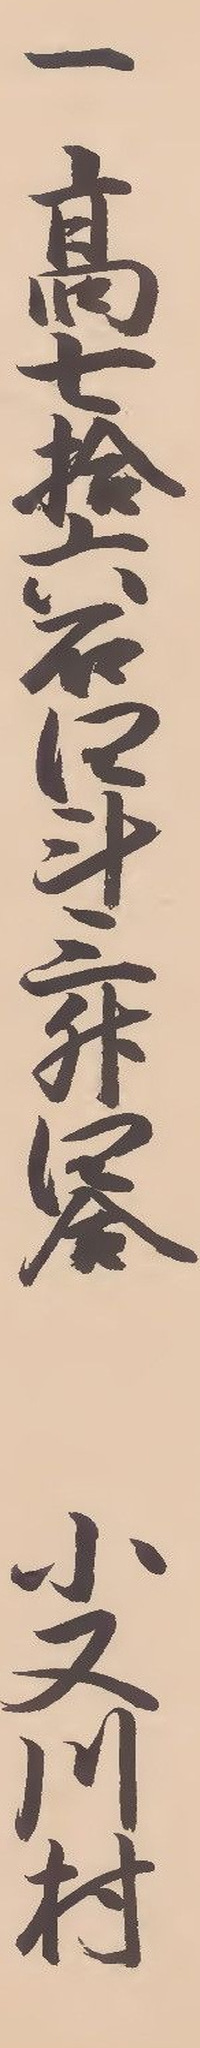一高七拾六石四斗三升四合小又川村

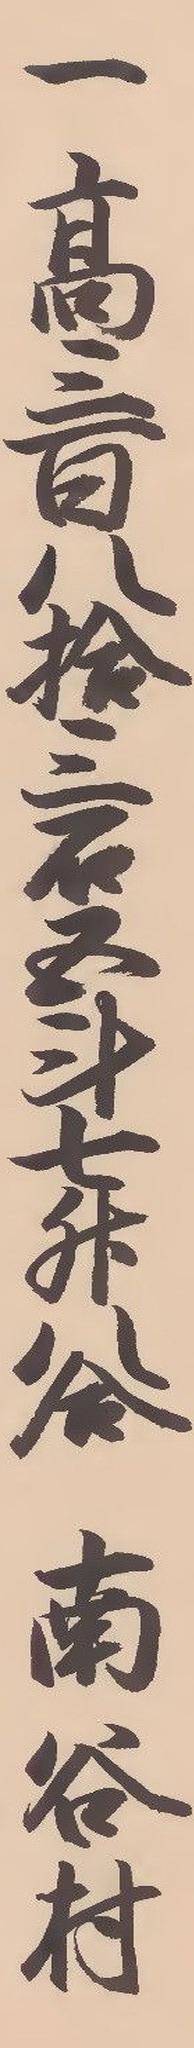一高三百八拾三石五斗七升八合南谷村
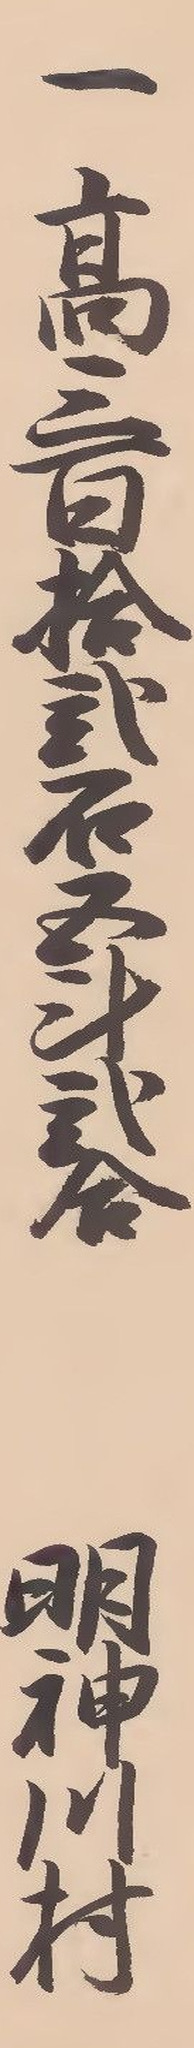一高三百拾弐石五斗弐合明神川村
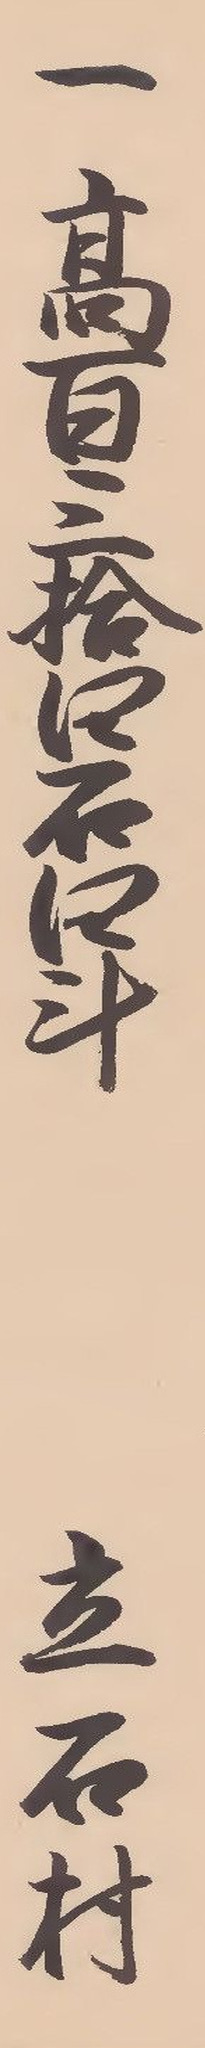一高百三拾四石四斗立石村
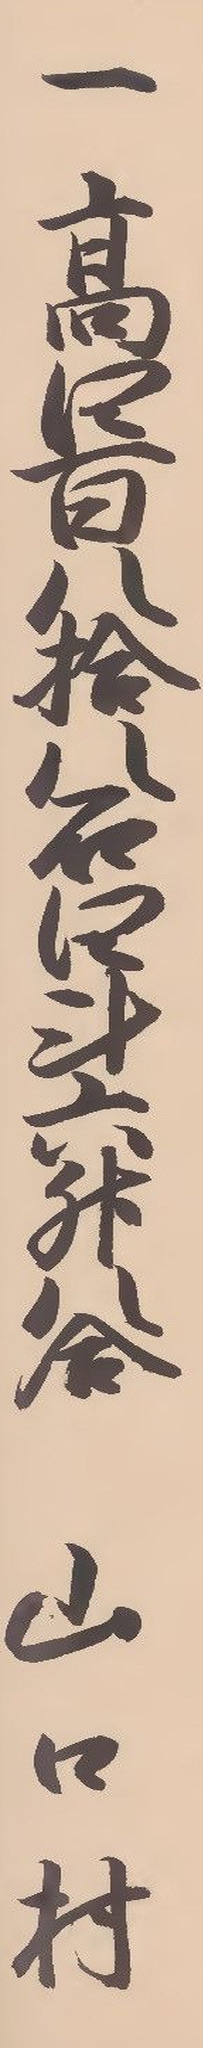一高四百八拾八石四斗六升八合山口村
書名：紀伊国郷帳
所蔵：国立公文書館 National Archives of Japan
